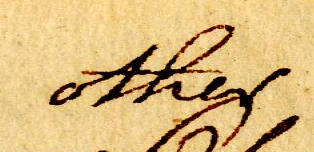other
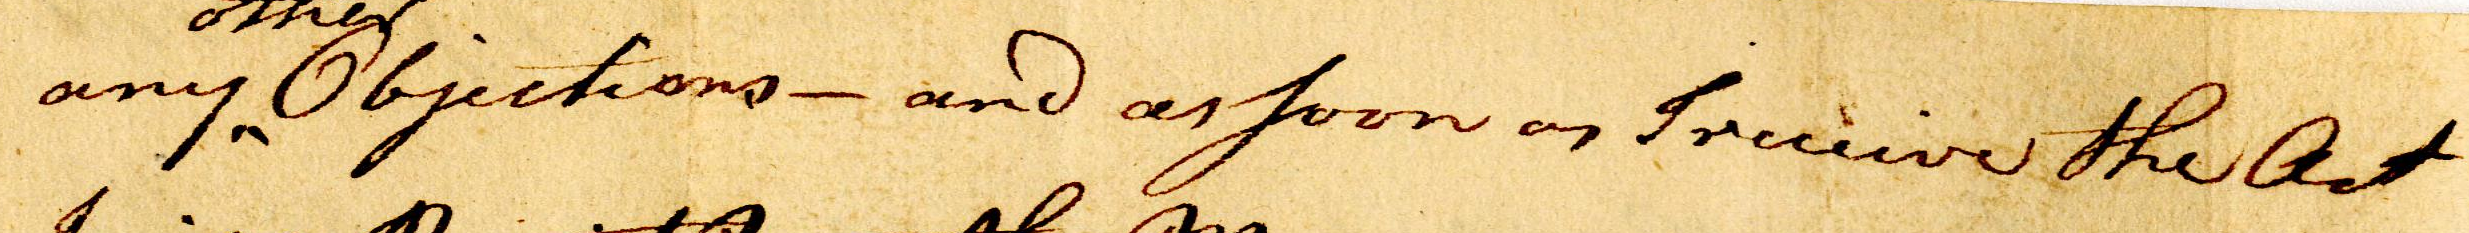any ^ Objections- and as soon as I receive the Ac^t
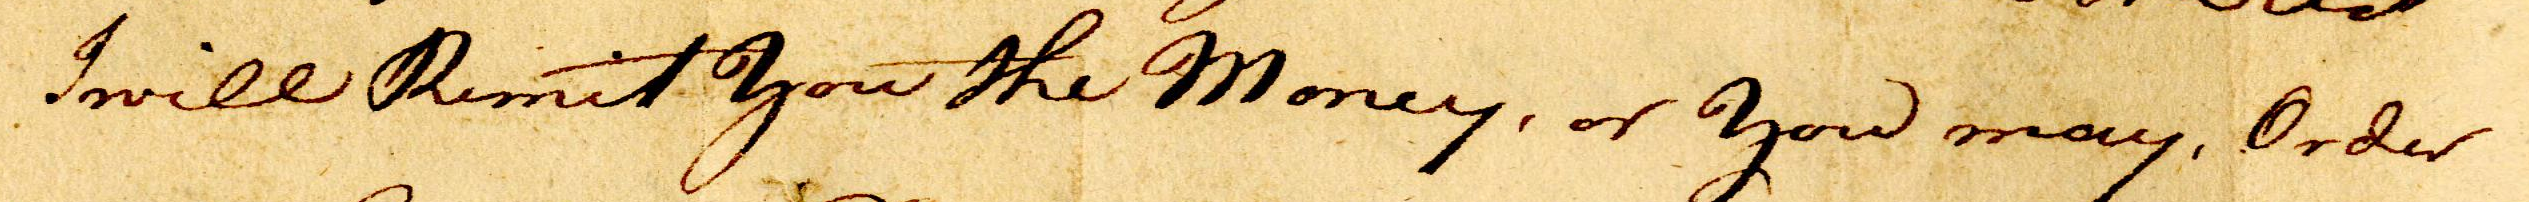I will Remit You the Money, or You may, Order
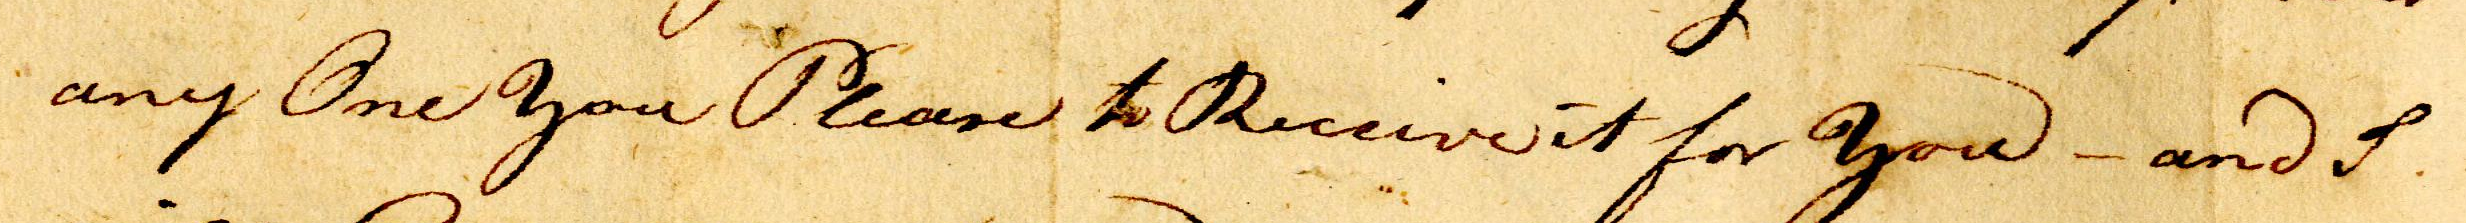any One You Please to Receive it for You- and I
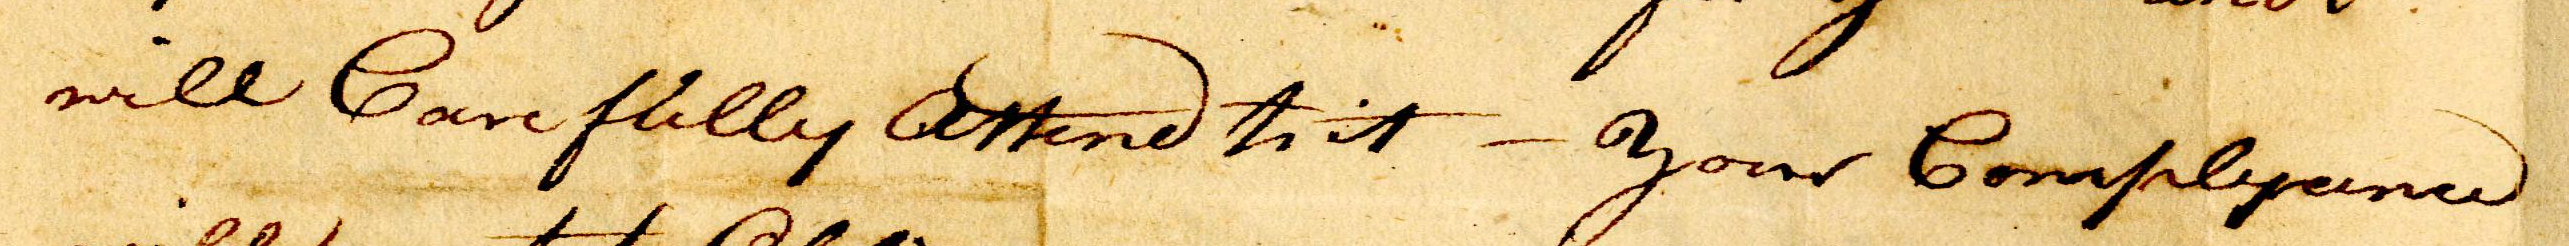will Carefully Attend to it- Your Complyance
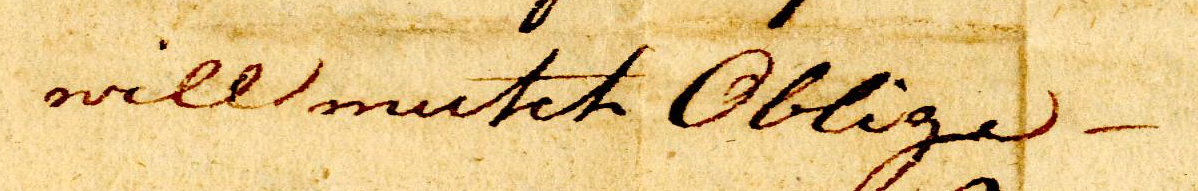will mutch Oblige-
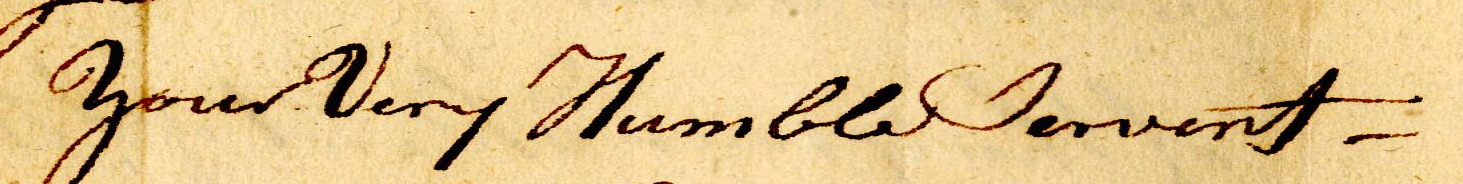Your Very Humble Servent-
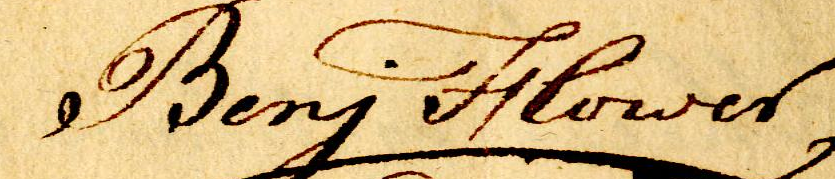Benj. Flower
